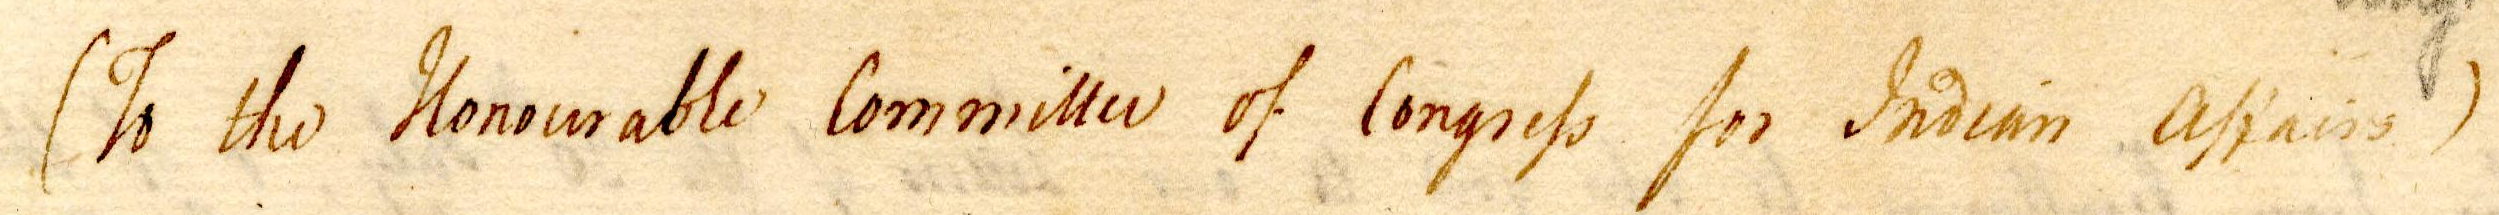(To the Honourable Commitee of Congress for Indian Affairs)
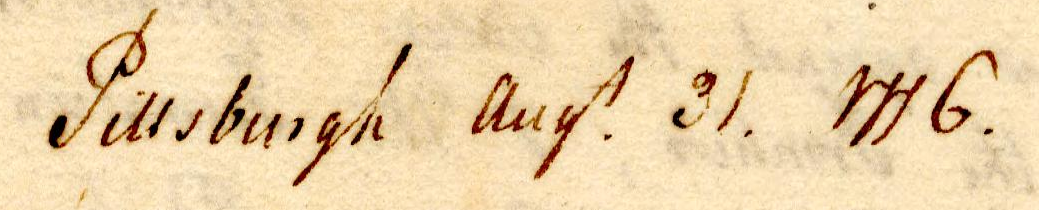Pittsburgh Aug^t. 31. 1776.
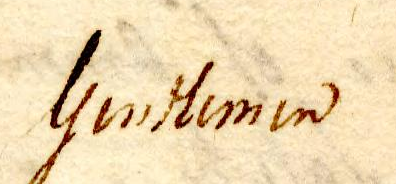Gentlemen
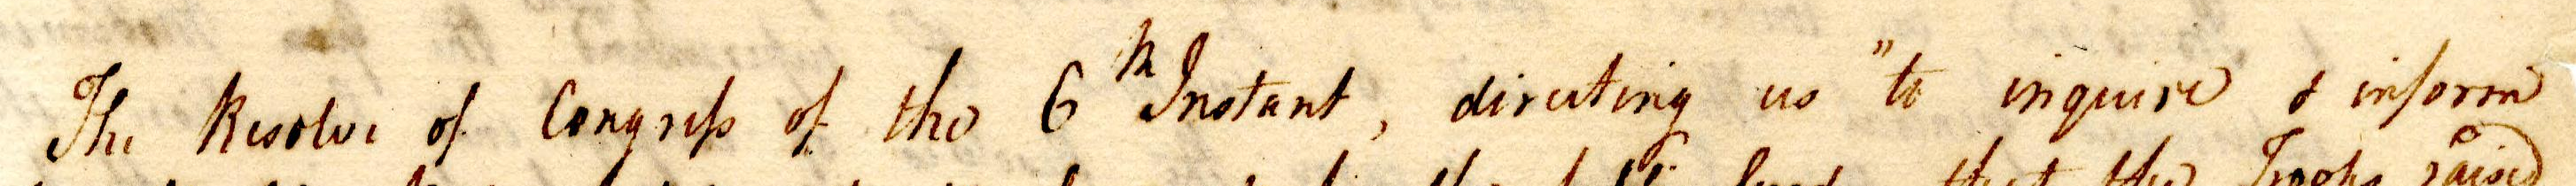The Resolve of Congress of the 6^th Instant, directing us "to inquire & inform
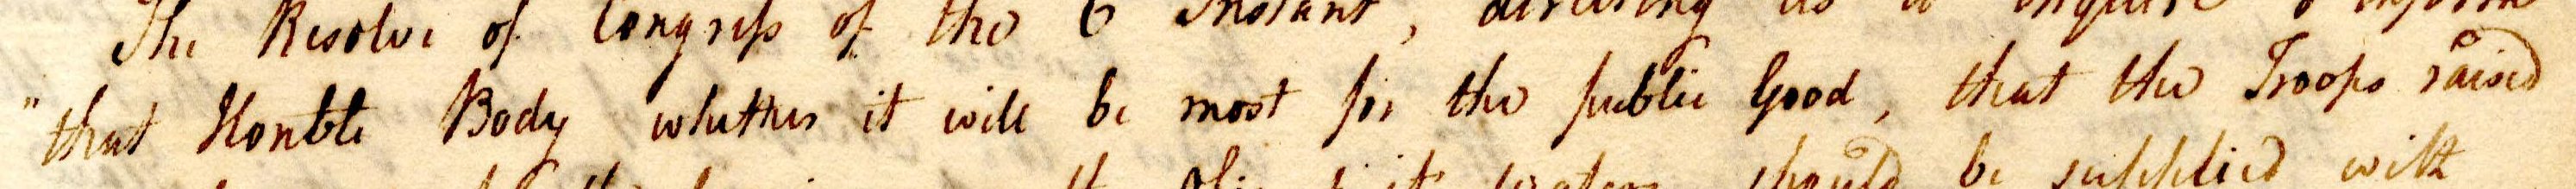"that Honble Body whether it will be most for the public Good, that the Troops raised
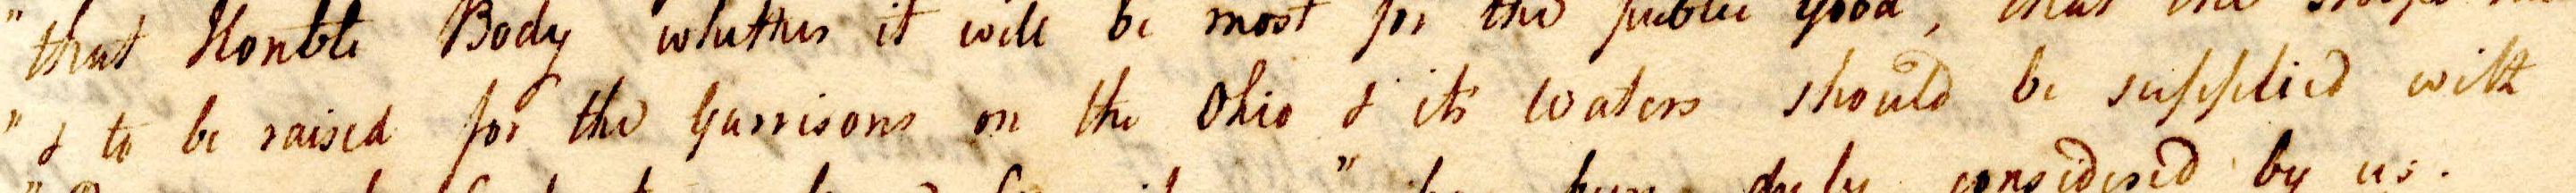"& to be raised for the Garrisons on the Ohio & its waters should be supplied with
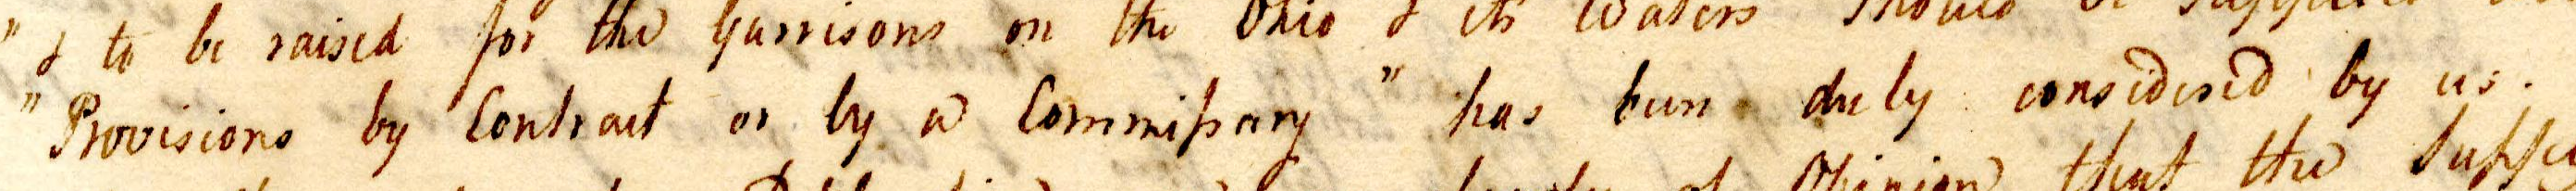"Provisions by Contract or by a Commissary" has been duly considered by us.
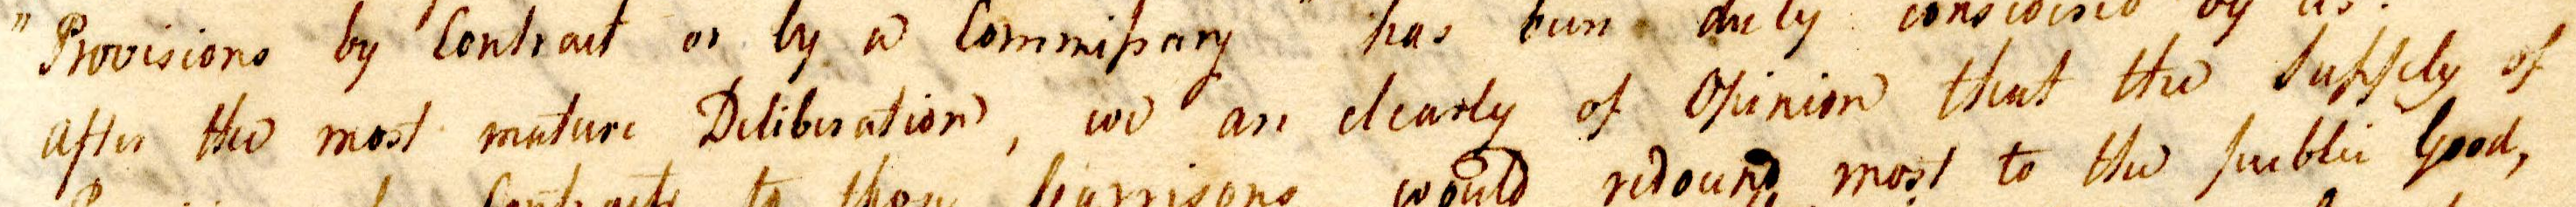After the most mature Deliberation, we are clearly of Opinion that the supply of
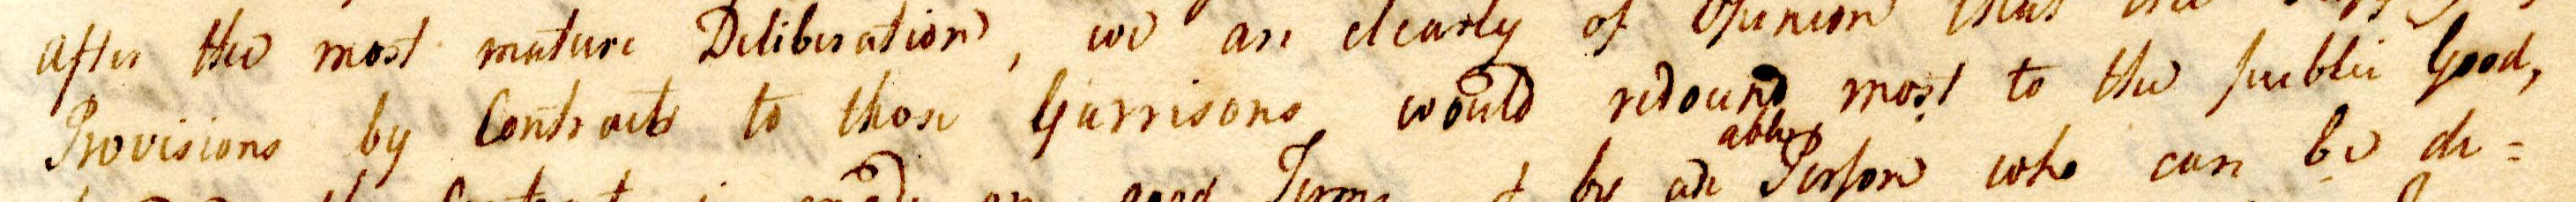Provisions by Contracts to those Garrisons would redound most to the public Good,
